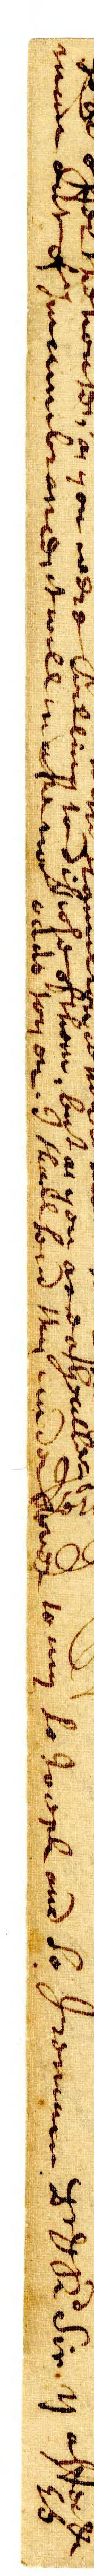man out of Incumbrance it will make no odds say on. I shall send them under cover to my So Joesph and So Iremam D^r & R^d Sir y^r affec^t &
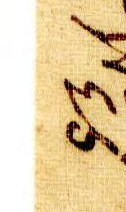ES
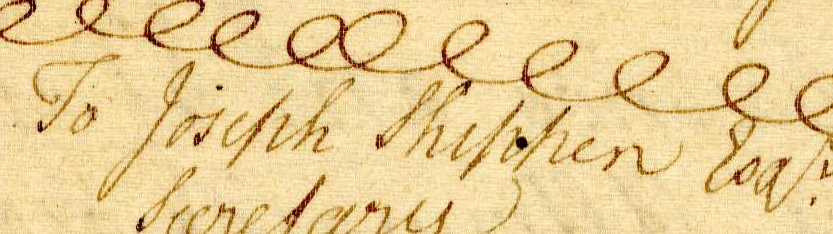To Joseph Shippen Esq^r.
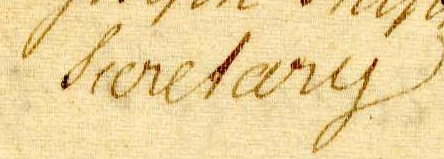Secretary
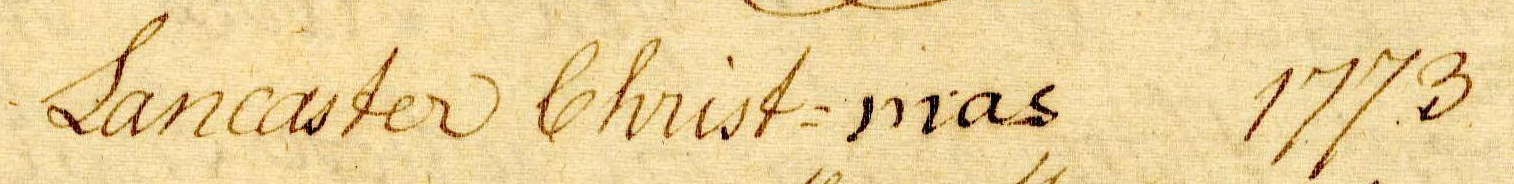Lancaster Christ-mas 1773
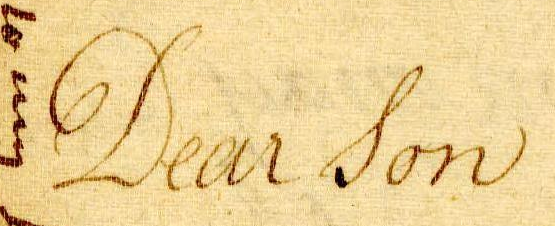Dear Son
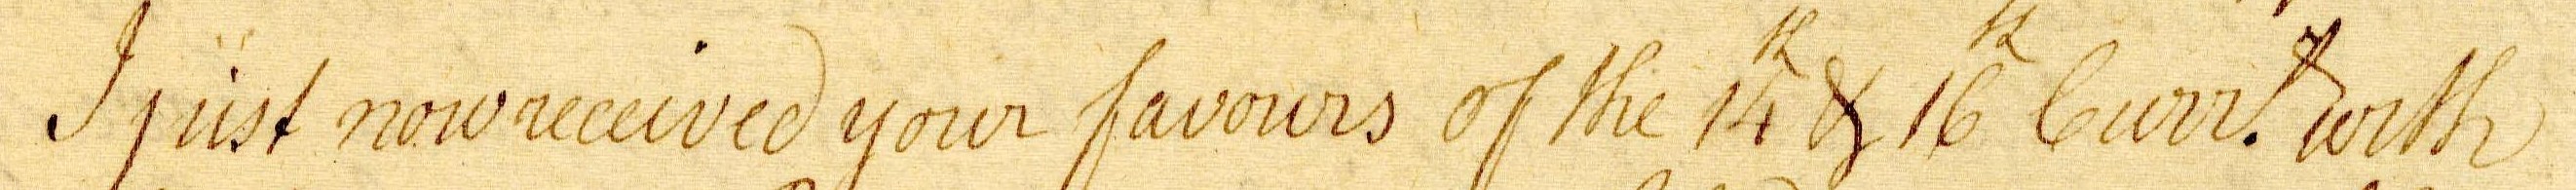I just now received your favours of the 14^th & 16^th Curr.^t with
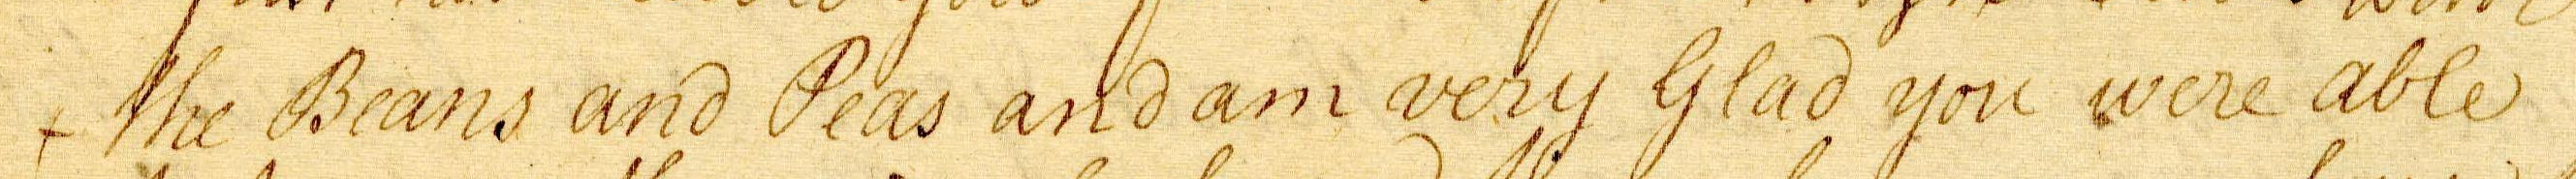+ the Beans and Peas and am very Glad you were able
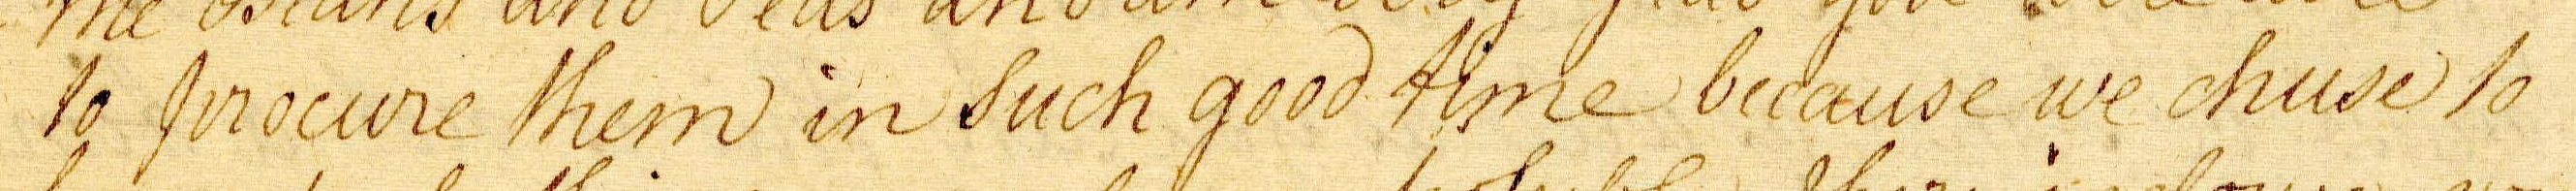to procure them in such good time because we chuse to
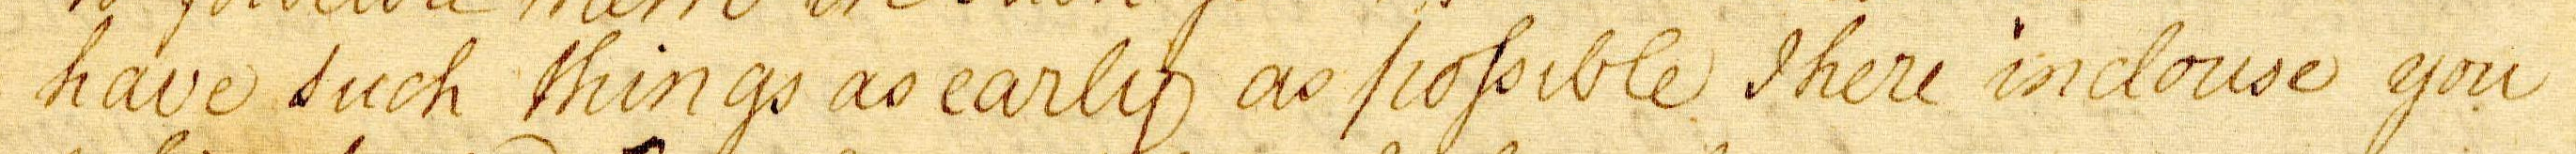have such things as early as possible I here inclouse you
